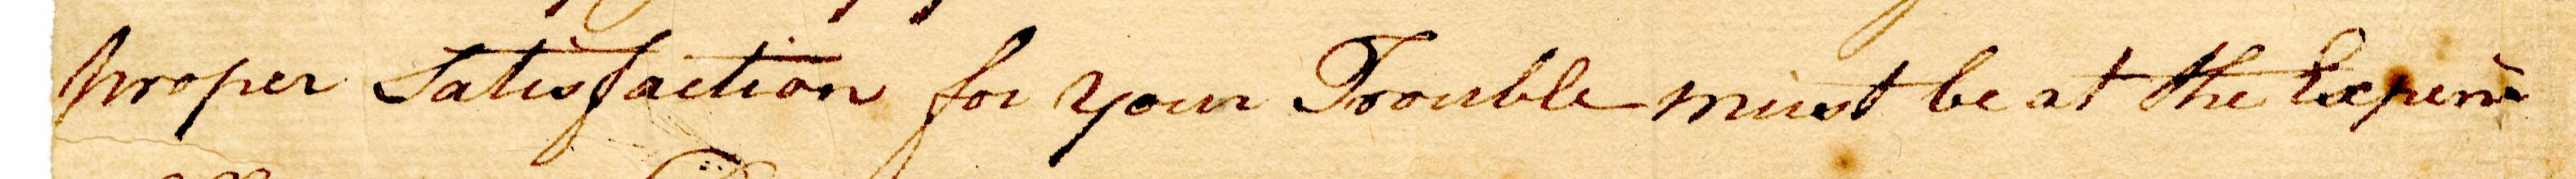proper Satisfaction for your Trouble must be at the Expens
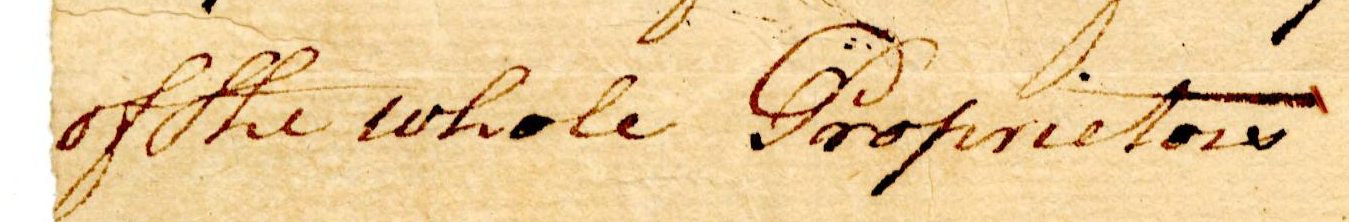of the whole Proprietors
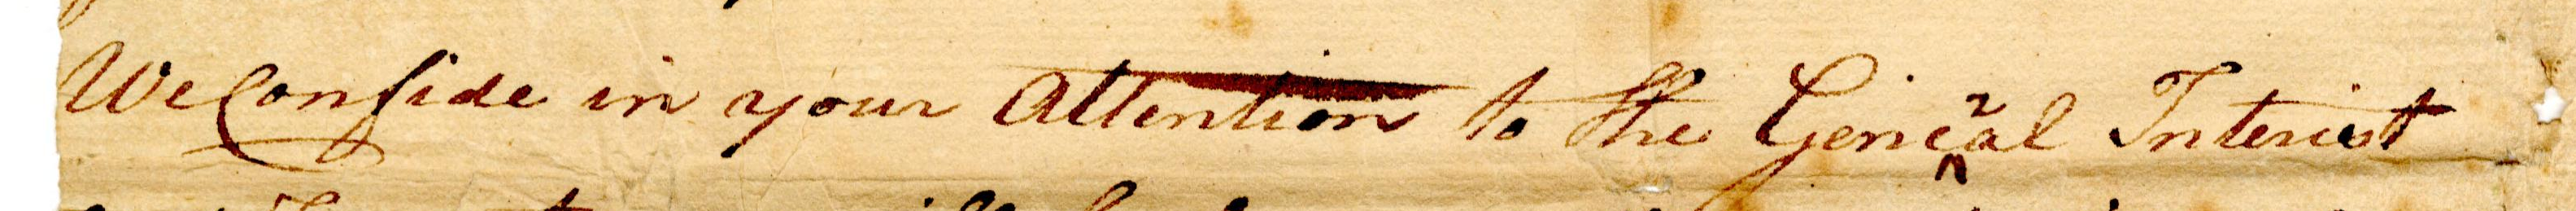We Confide in your Attention to the Gene^ral Interist
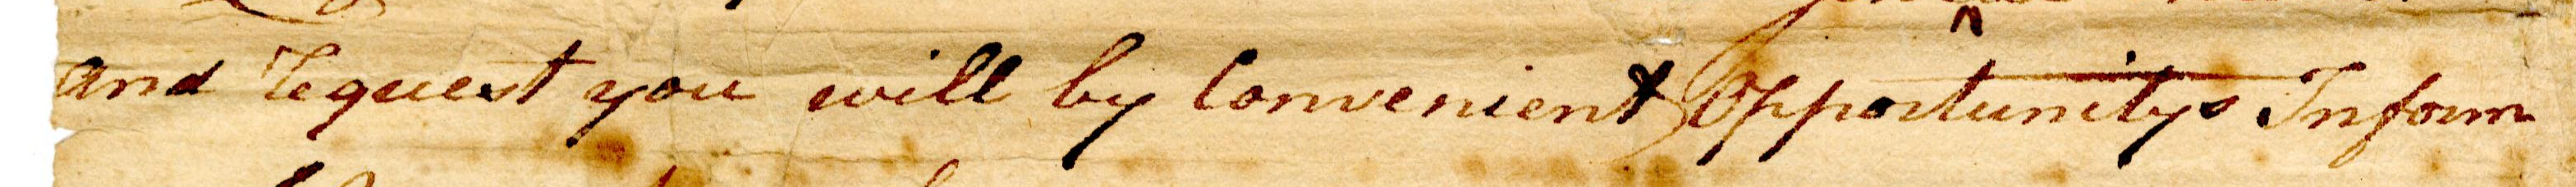and request you will by convenient opportunity's Inform
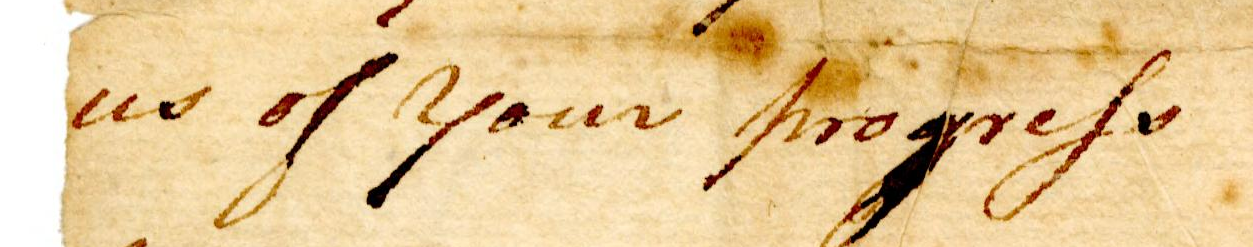us of your progress
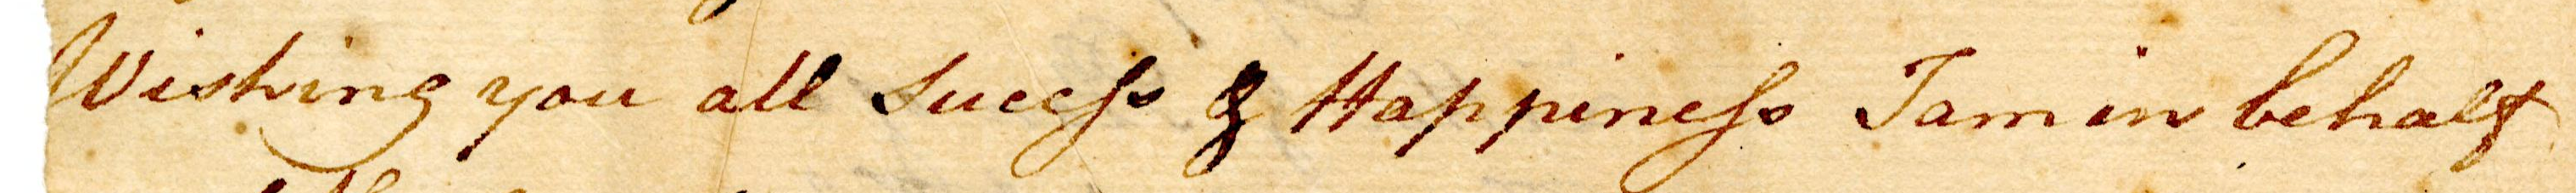Wishing you all sucess & Happiness I am in behalf
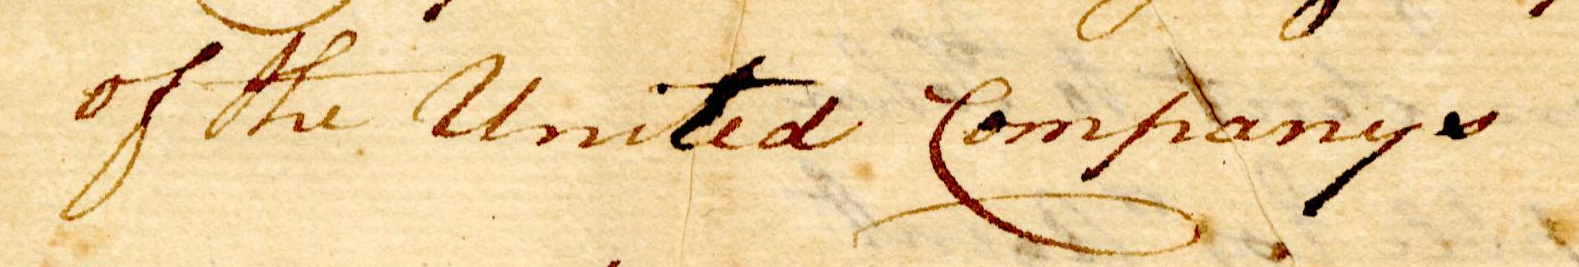of the United Companys
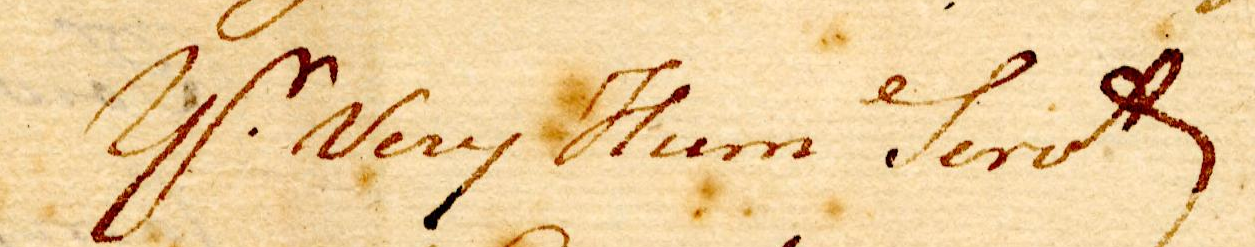Y^r. Very Hum^l. Serv^t
